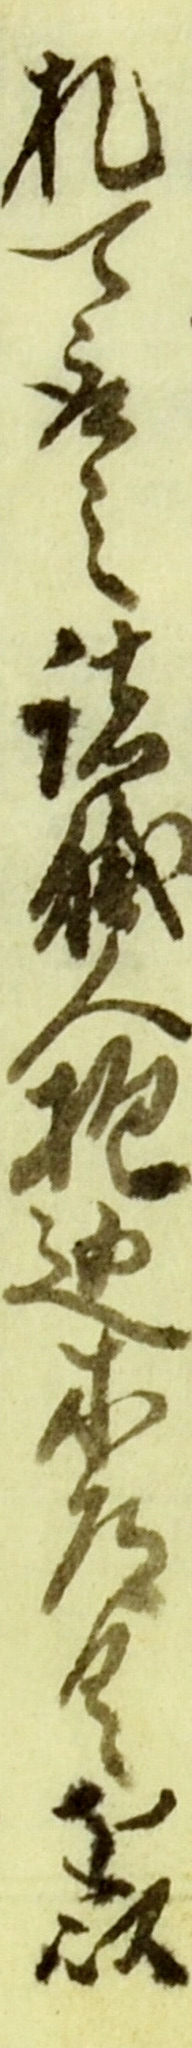札可取之諸職人抱込木道具を以
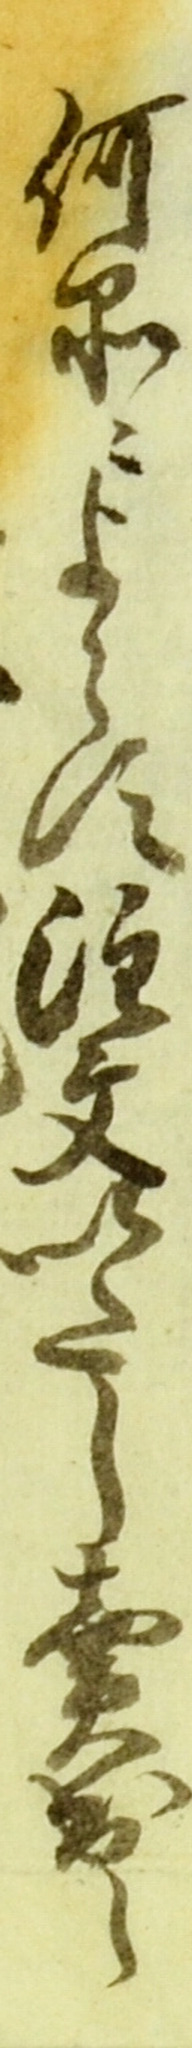何品ニよらす注文いたし売出し
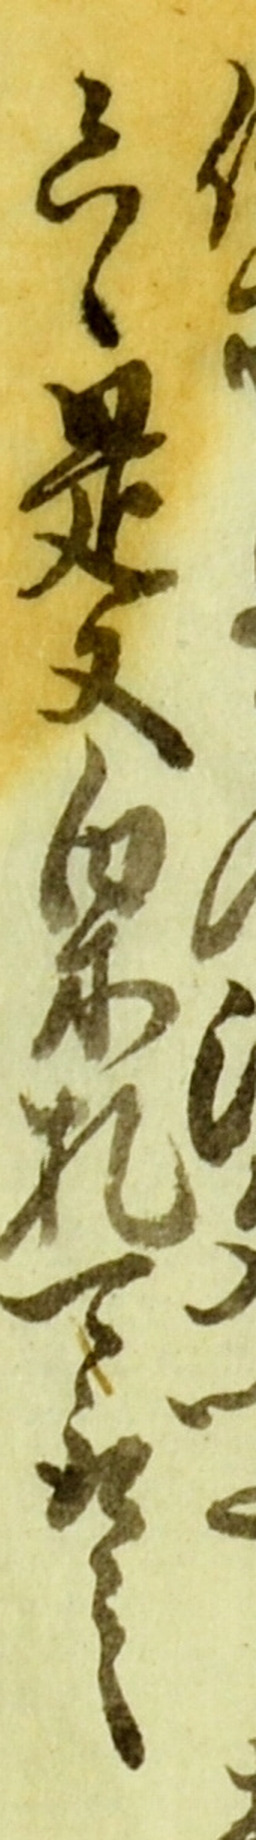候ハゝ是又白木札可取之

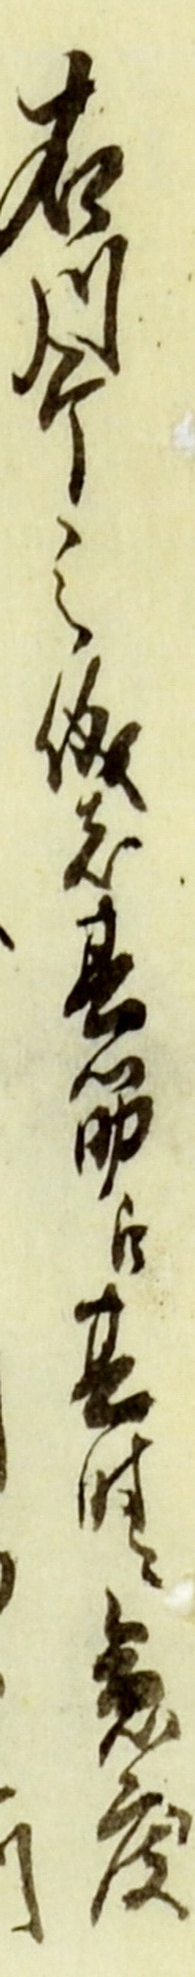右川干之儀者其筋江其時々急度
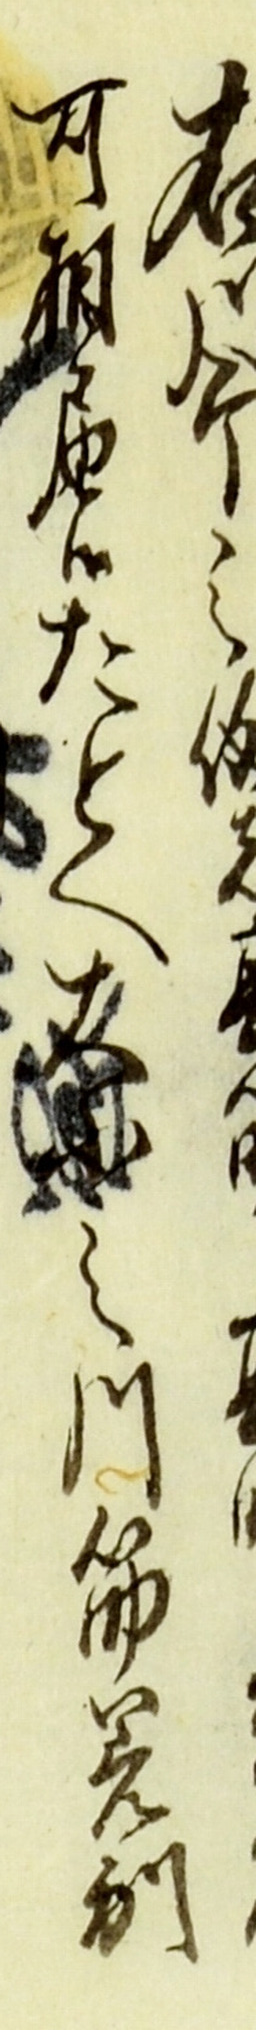可相届候たとへ大小之川筋差別
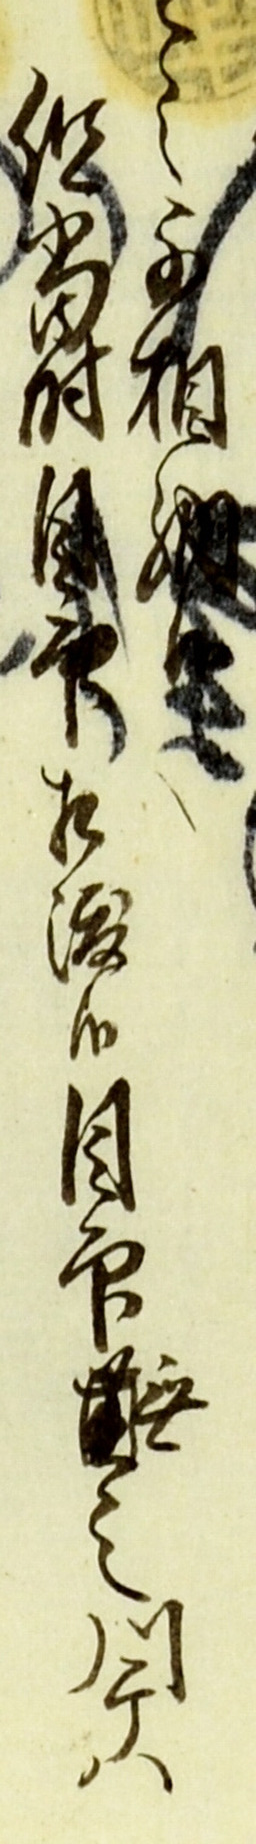但当時目印相渡候目印無之川干ハ
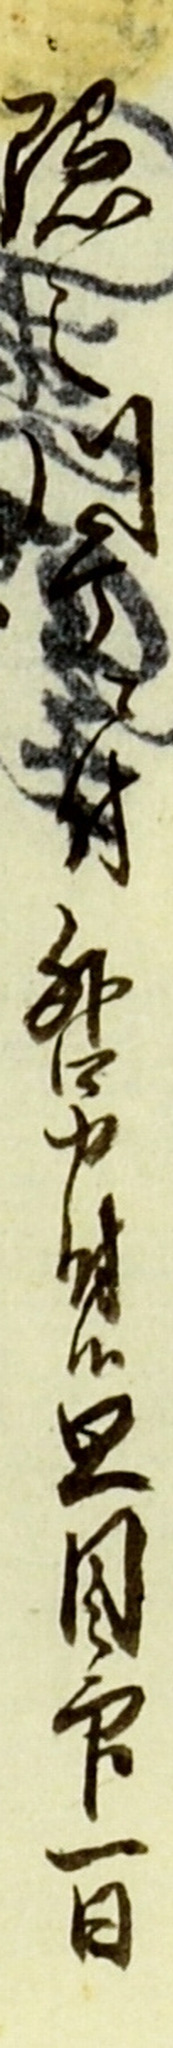隠之川干ニ付咎申付候且目印一日
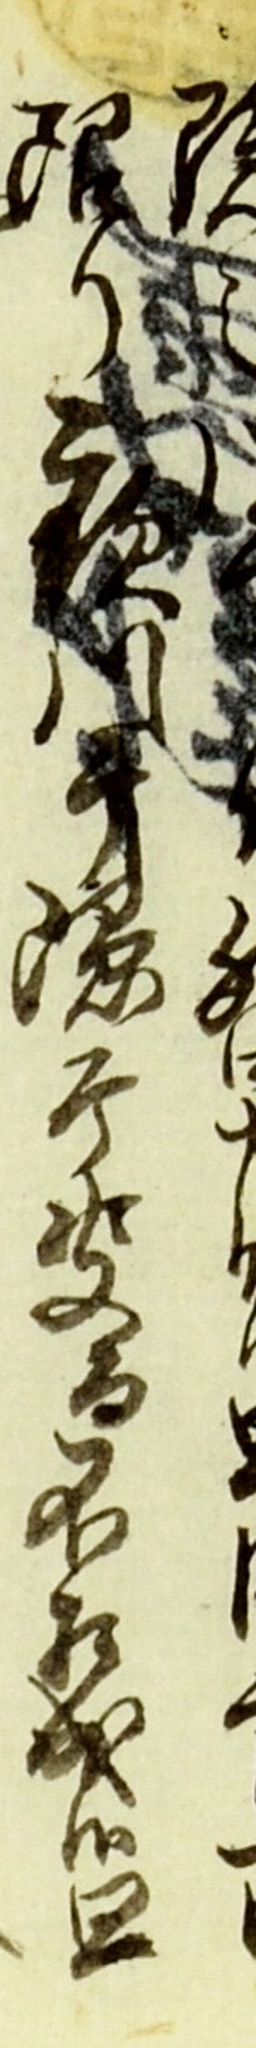限り夜川干隠干決而不相成候且
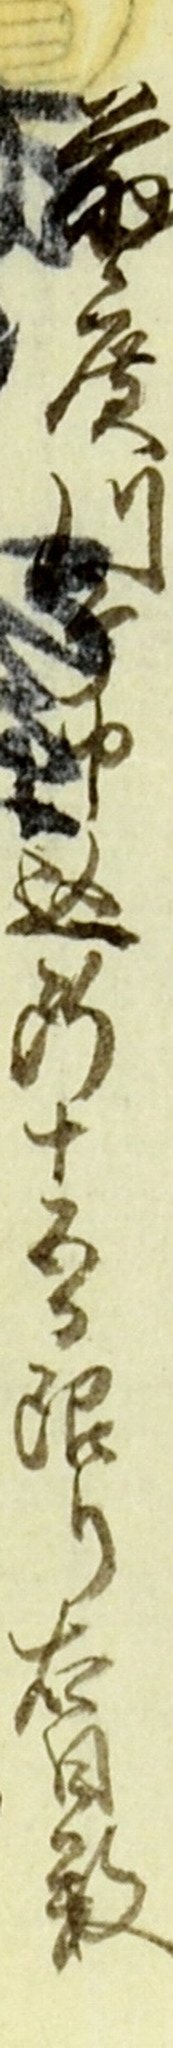前広川干申込断十五日限り右日数
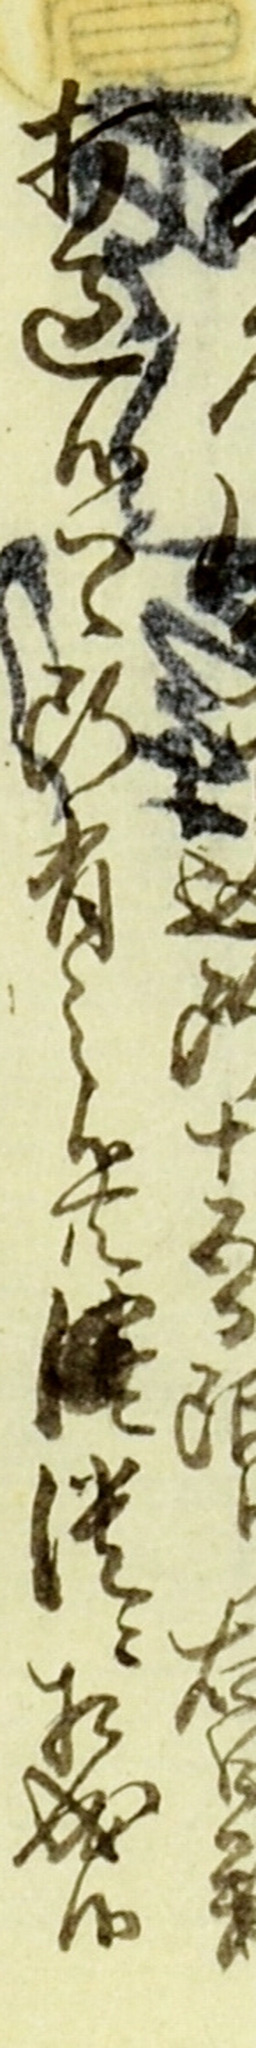打過候ハゝ断有之候共潰ニ相成候
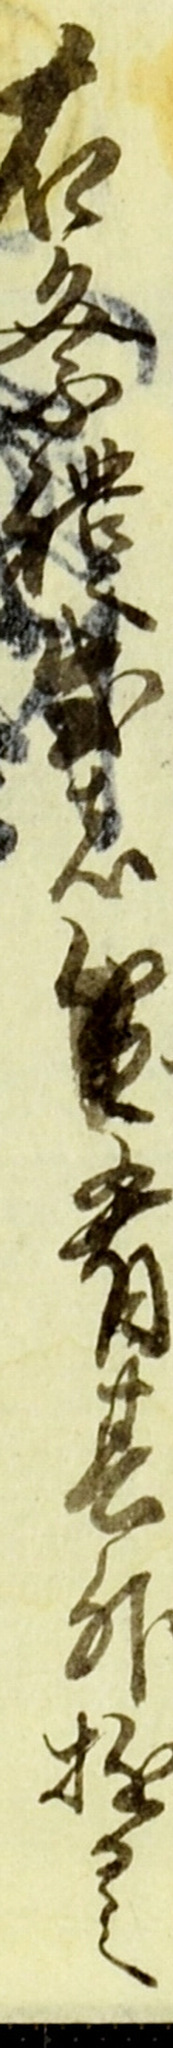右祭礼或者盆肴其外遊日之
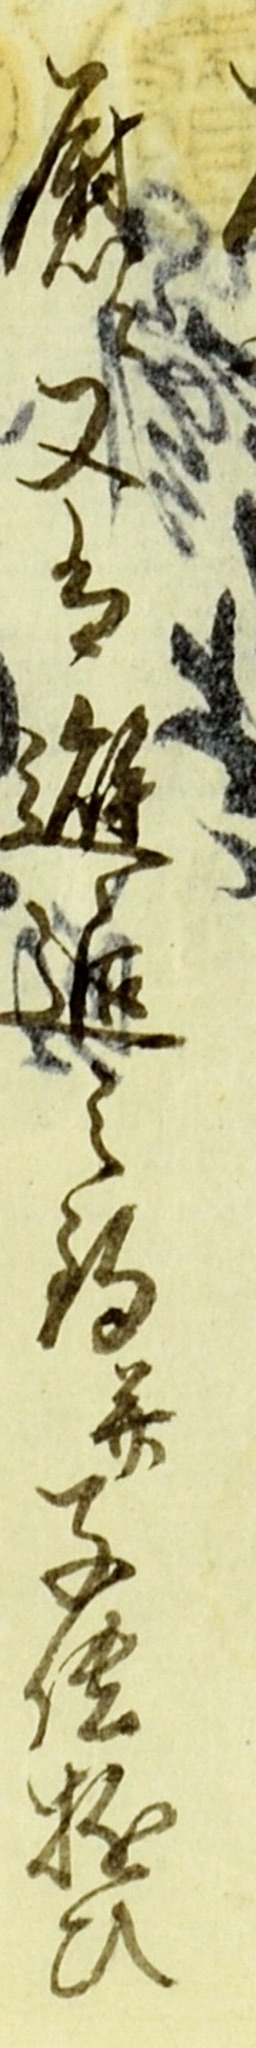慰ミ又は邂逅之釣幷子供遊ひ
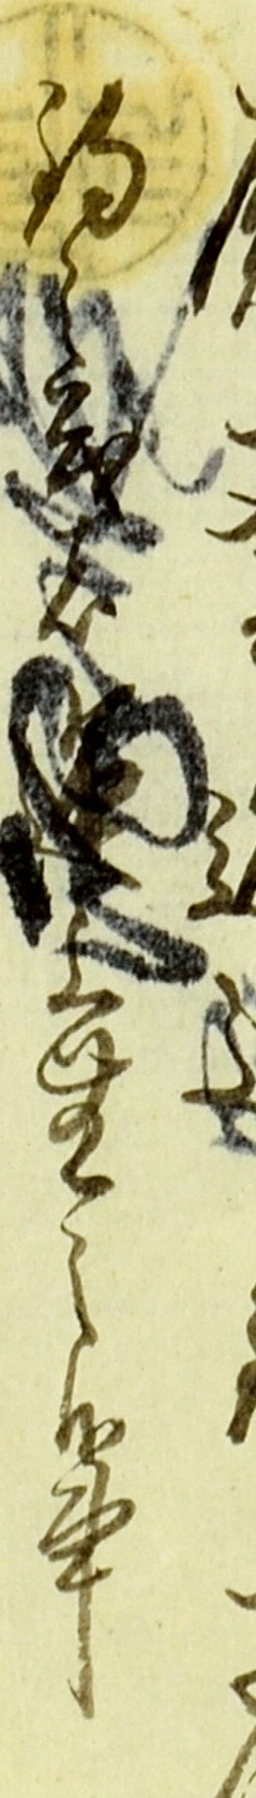釣之義者運上無之候事
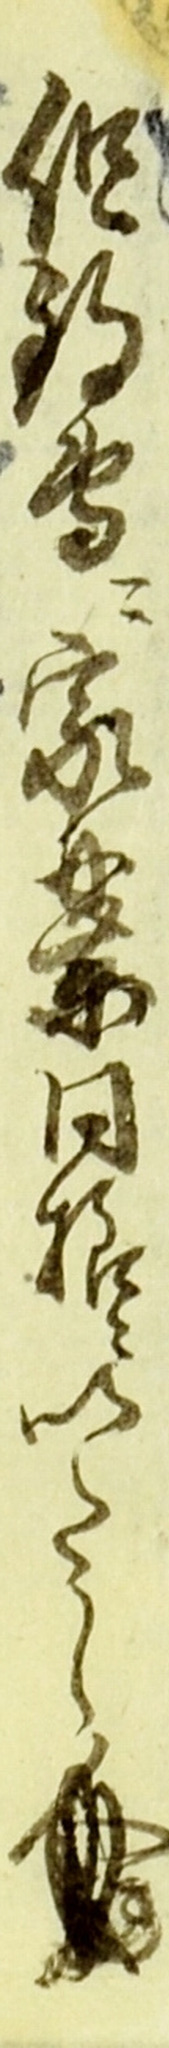但釣専ニ家業同様ニいたし
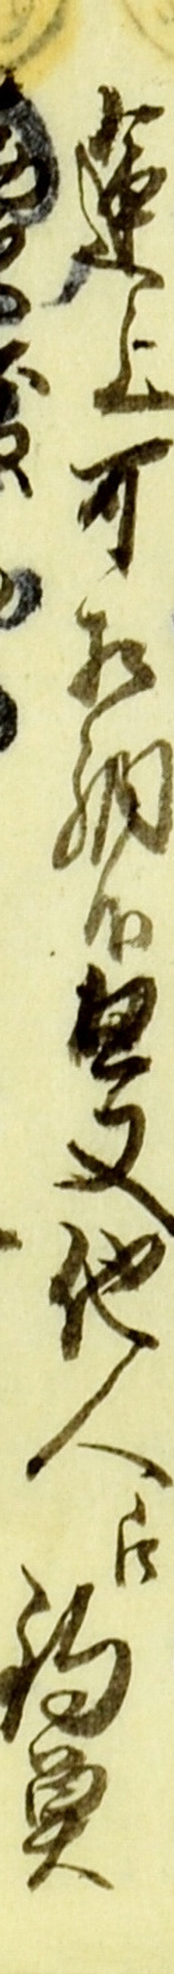運上可相納候且又他人江釣魚
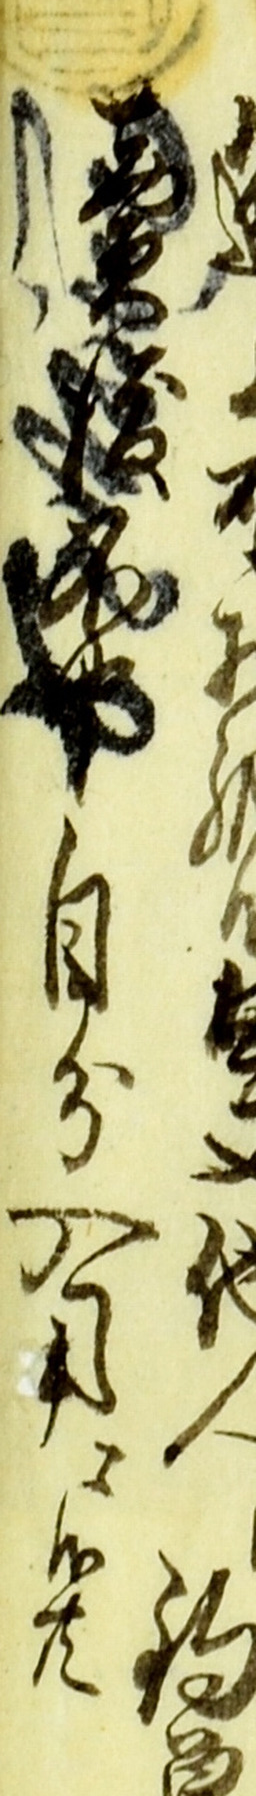売渡不申自分入用ニ候共
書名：分一方諸運上御定法
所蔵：伊那市立高遠町図書館・合同会社AMANE
